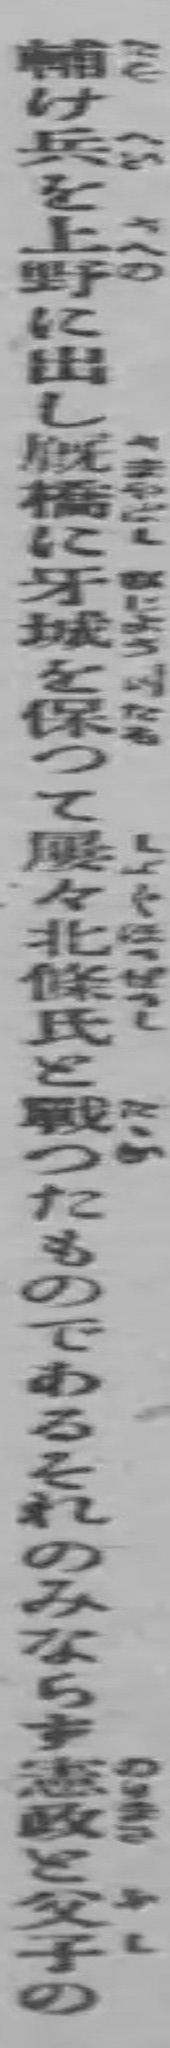輔け兵を上野に出し厩橋に牙城を保つて屡々北条氏と戦つたものであるそれのみならず憲政と父子の
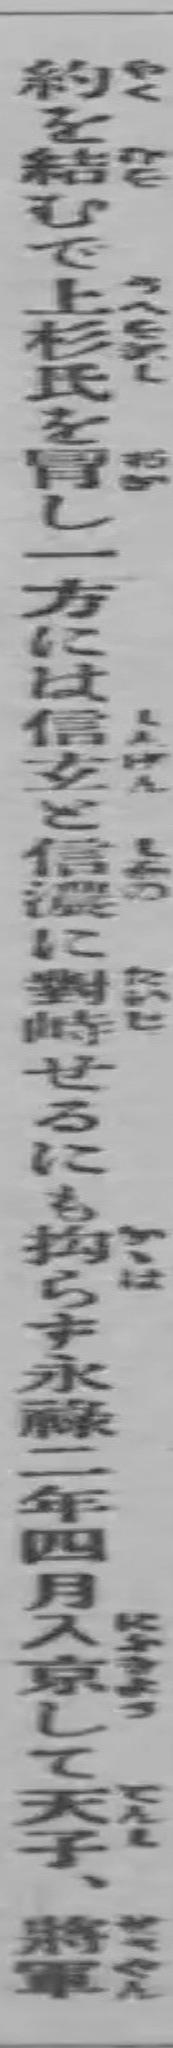約を結むで上杉氏を冒し一方には信玄と信濃に対峙せるにも拘らず永禄二年四月入京して天子、将軍
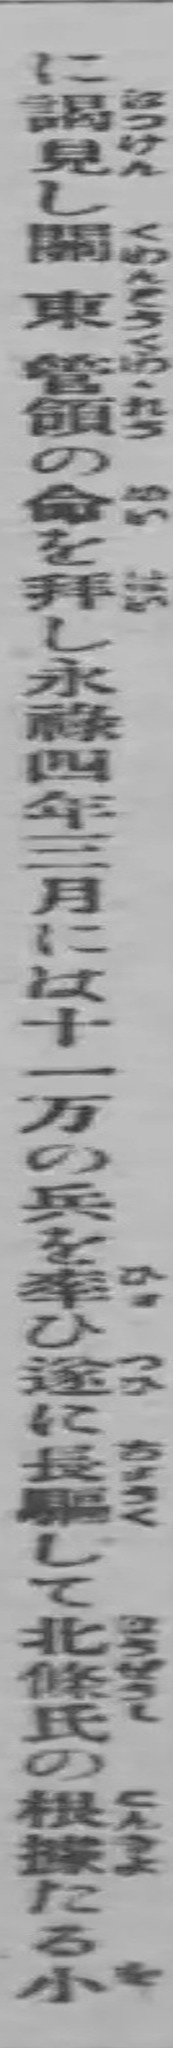に謁見し関東管領の命を拝し永禄四年三月には十一万の兵を率ひ遂に長駆して北条氏の根拠たる小
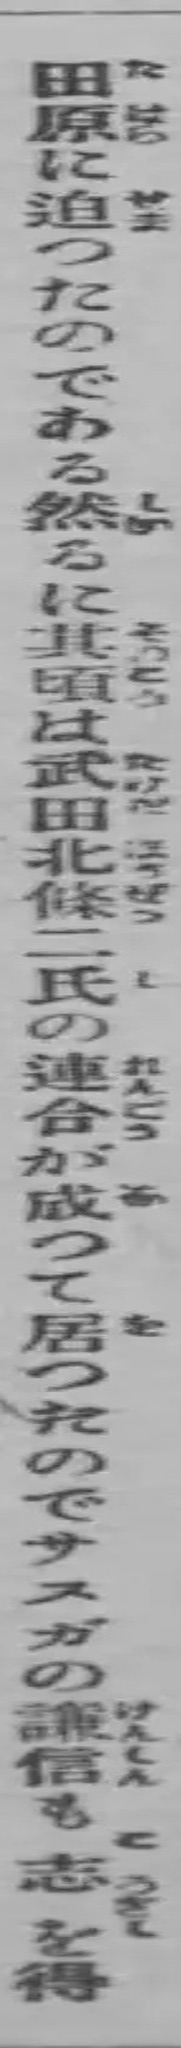田原に迫つたのである然るに其頃は武田北条二氏の連合が成つて居つたのでサスガの謙信も志を得
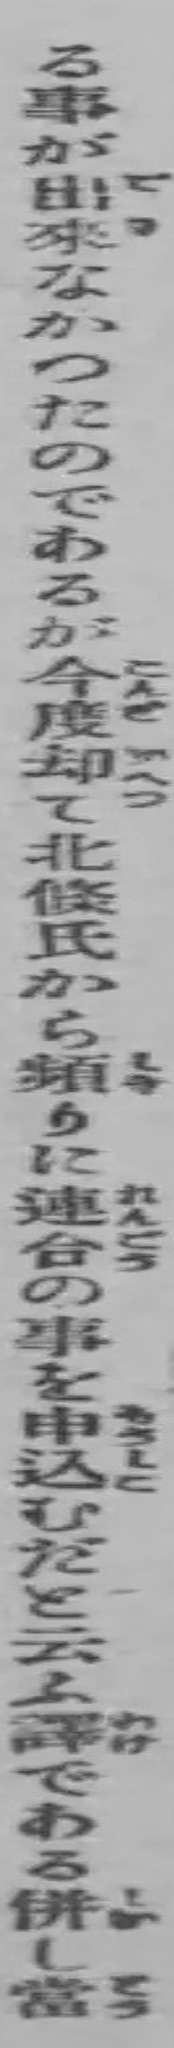る事が出来なかつたのであるが今度却て北条氏から頻りに連合の事を申込むだと云ふ訳である併し当
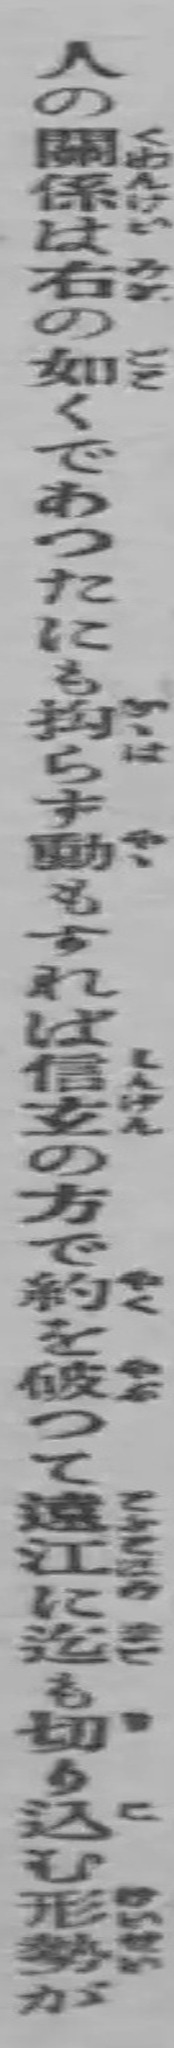人の関係は右の如くであつたにも拘らず動もすれば信玄の方で約を破つて遠江に迄も切り込む形勢が
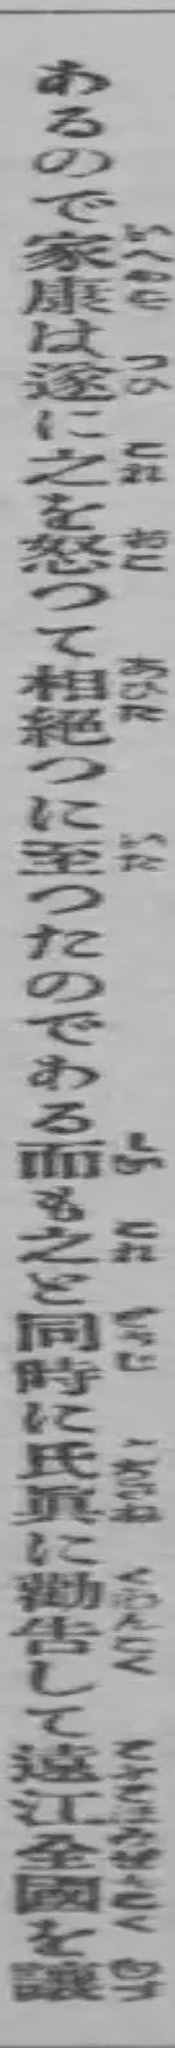あるので家康は遂に之を怒つて相絶つに至つたのである而も之と同時に氏真に勧告して遠江全国を譲
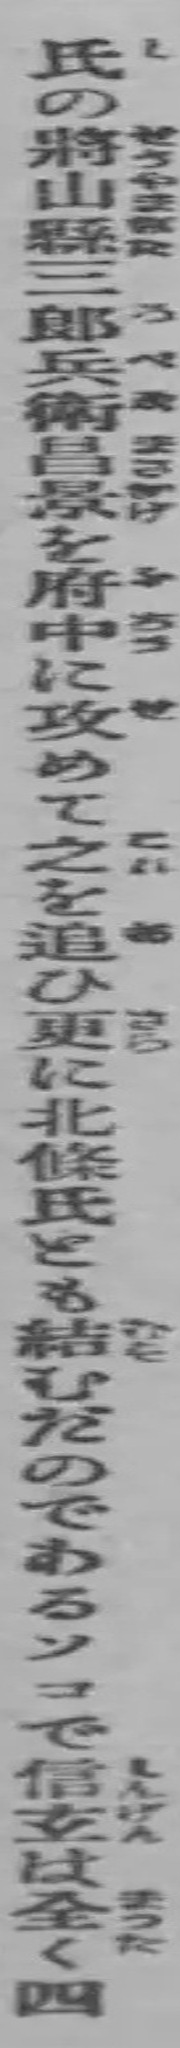氏の将山縣三郎兵衛昌景を府中に攻めてこ之を追ひ更に北条氏とも結むだのであるソコで信玄は全く四
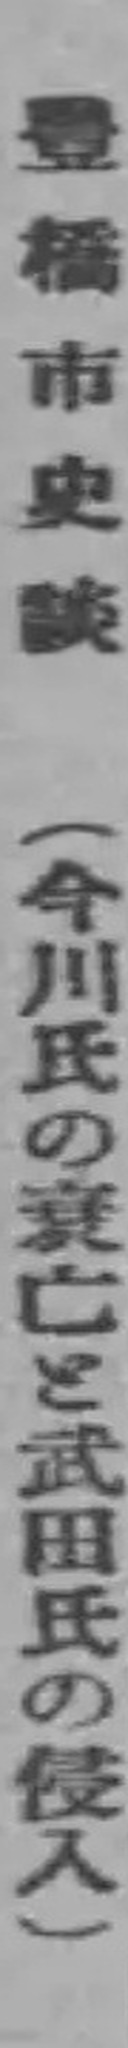豊橋市史談(今川氏の衰亡と武田氏の侵入)百二

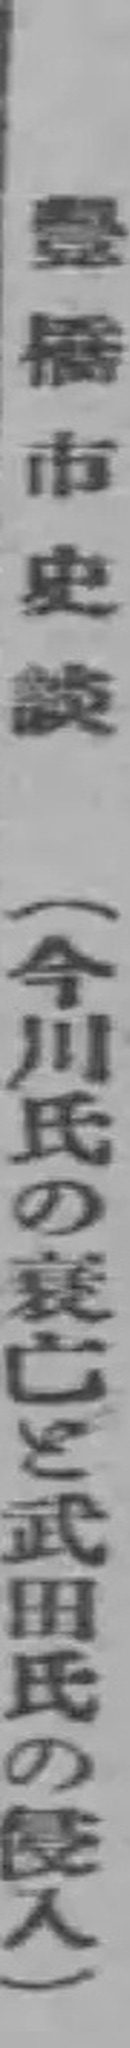豊橋市史談(今川氏の衰亡と武田氏の侵入)百四
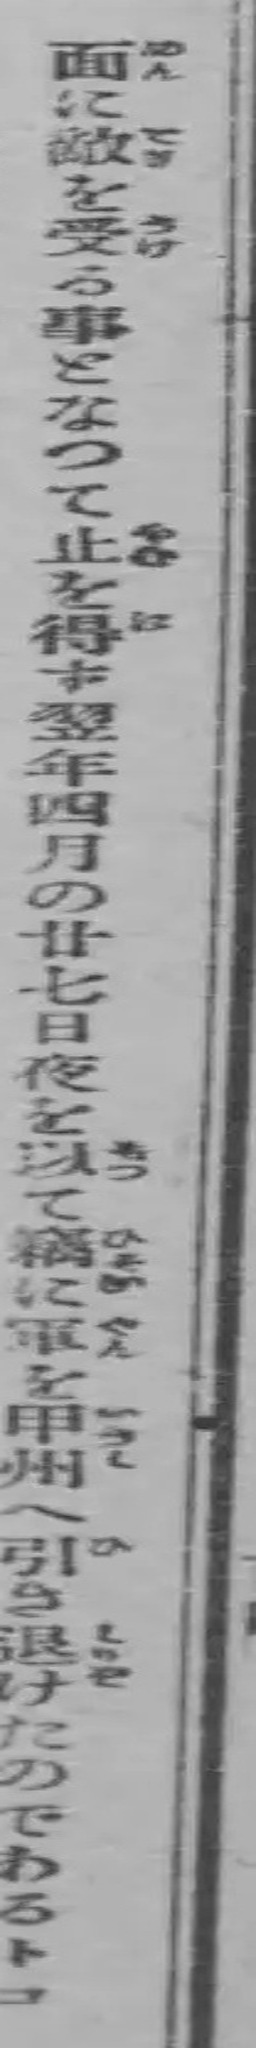信玄の退軍面に敵を受る事となつて止を得ず翌年四月の廿七日夜を以てに竊に軍を甲州へ引き退けたのであるトコ
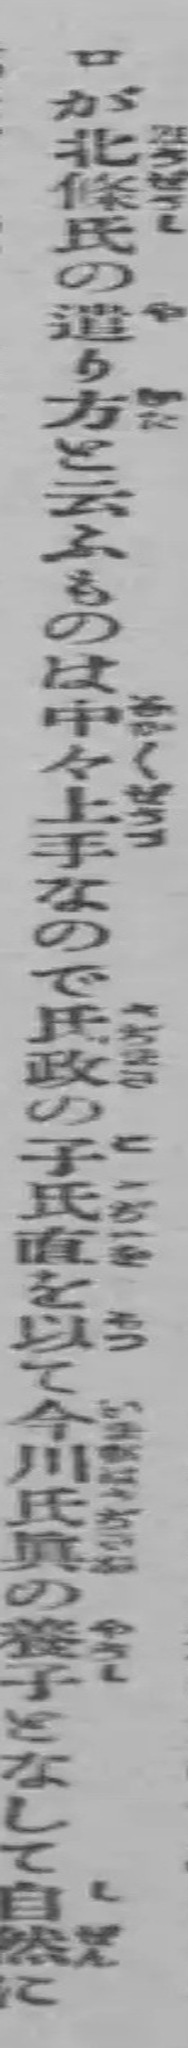ロが北条氏の遣り方と云ふものは中々上手なので氏政の子氏直を以て今川氏真の養子となして自然に
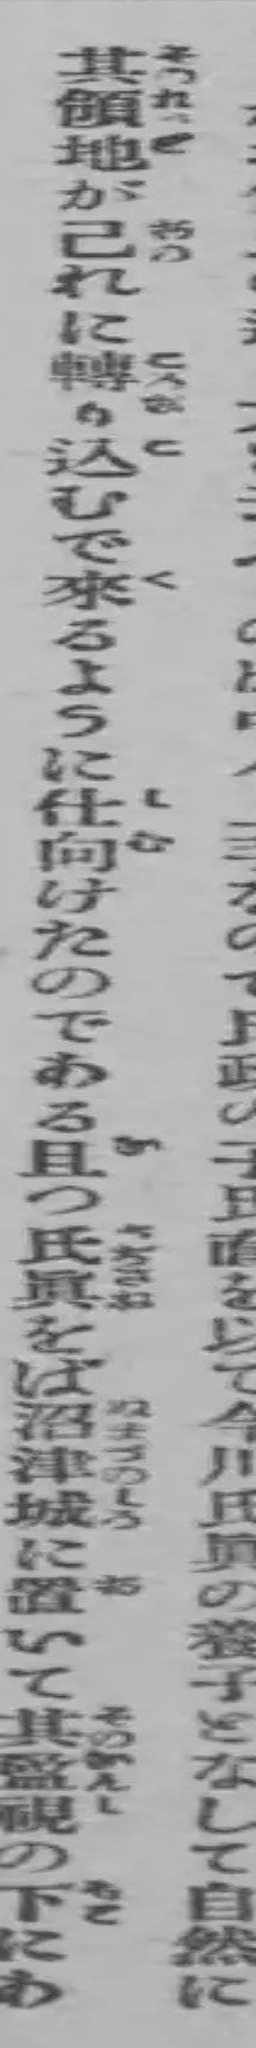其領土が己れに転り込むで来るように仕向けたのである且つ氏真をば沼津城に置いて其監視の下にあ
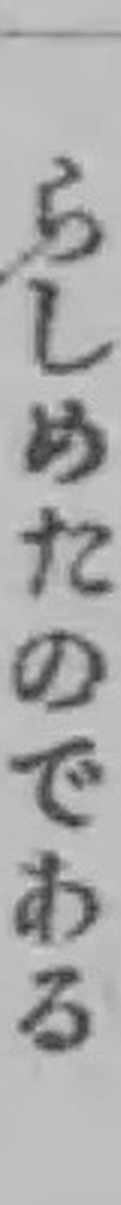らしめたのである
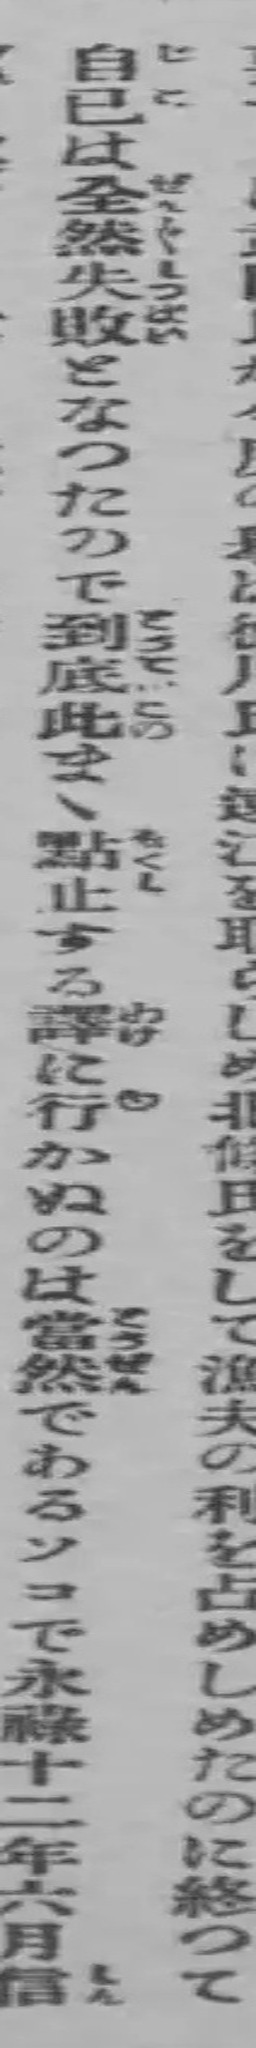自己は全然失敗となつたので到底此まゝ黙止する訳に行かぬのは当然であるソコで永禄十二年六月信
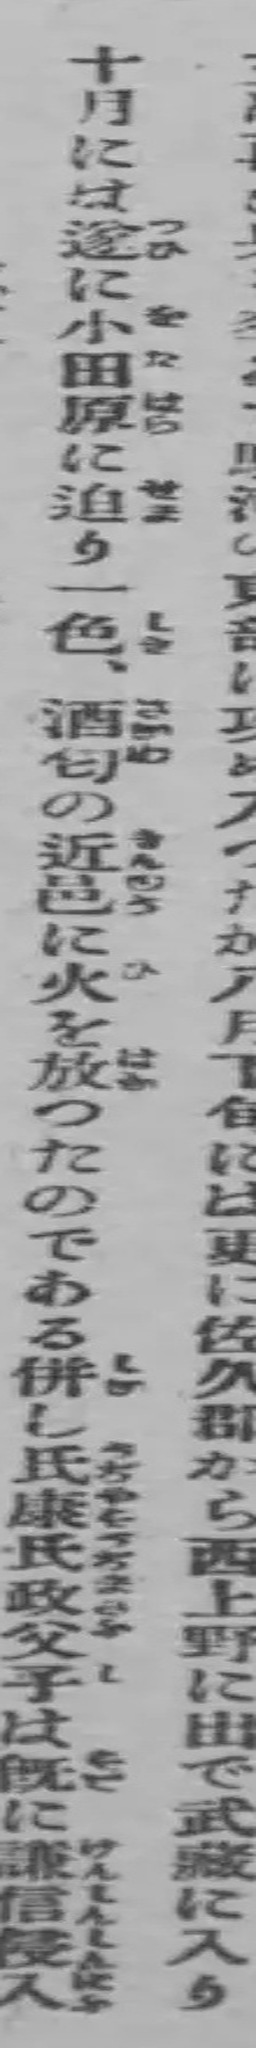十月には遂に小田原に迫り一色、酒匂の近邑に火を放つたのである併し氏康氏政父子は既に謙信侵入
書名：豊橋市史談
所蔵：国立国会図書館 National Diet Library, JAPAN
